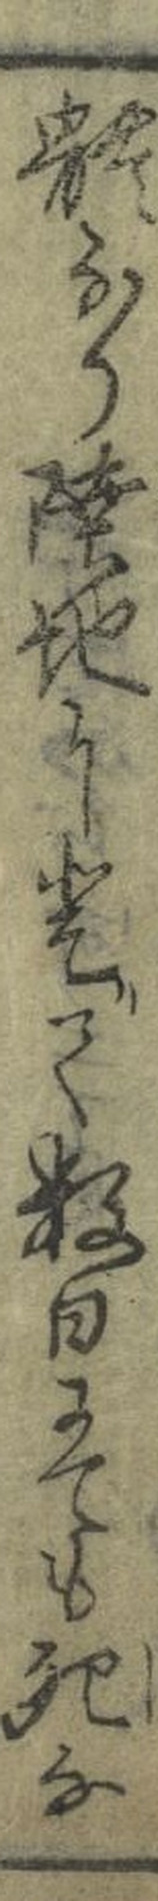体なり陸地に登りて数日にても死な
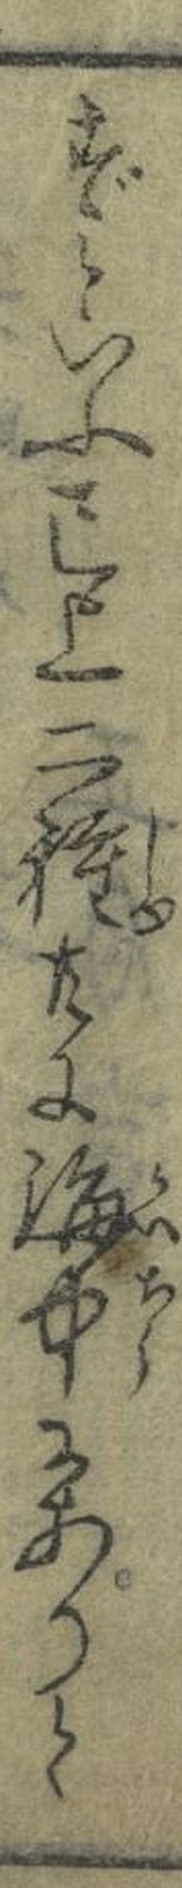ずといふ已上二種共に海中にありと
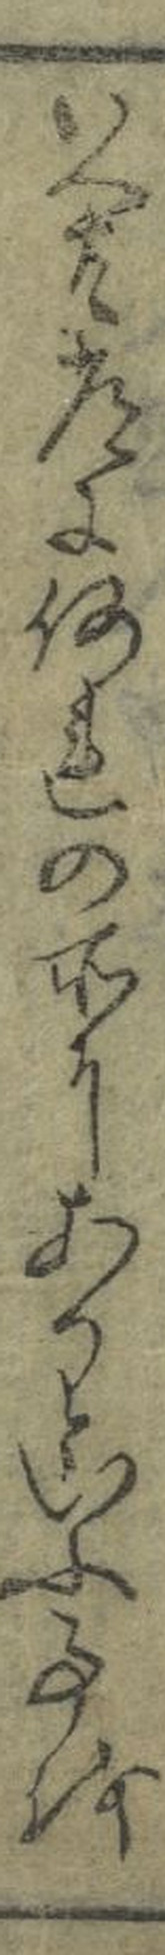いへ共常に何れの所にありといふ事を
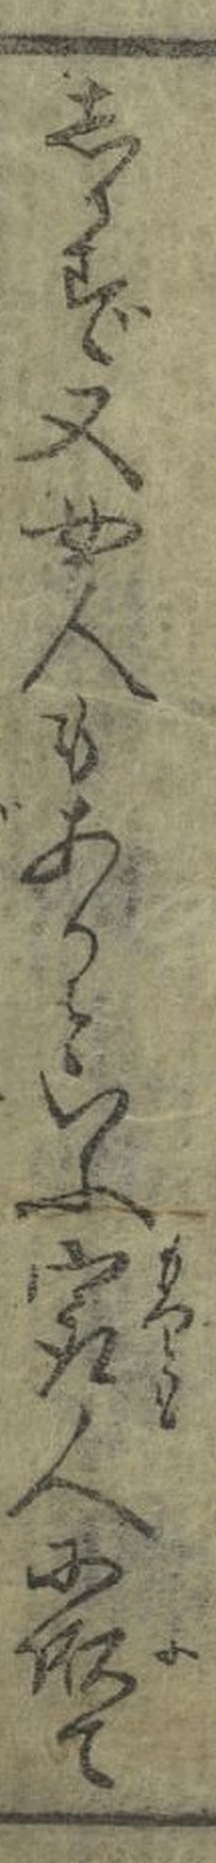しらず又女人もありといふ最人に似て
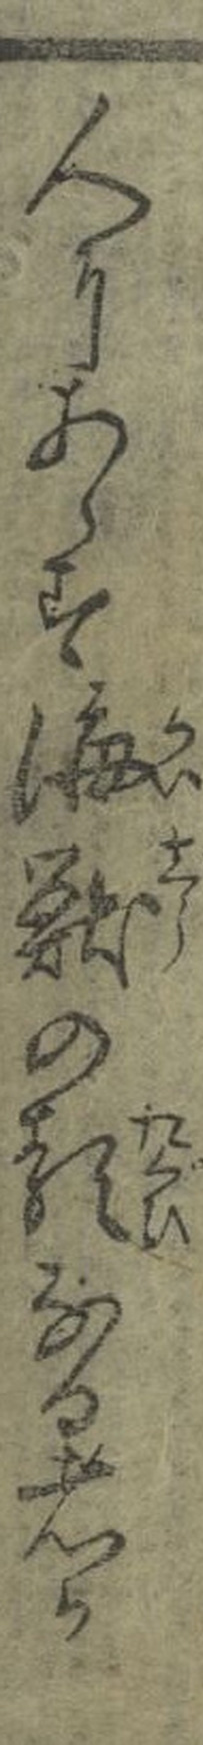人にあらす海獣の類なる者か

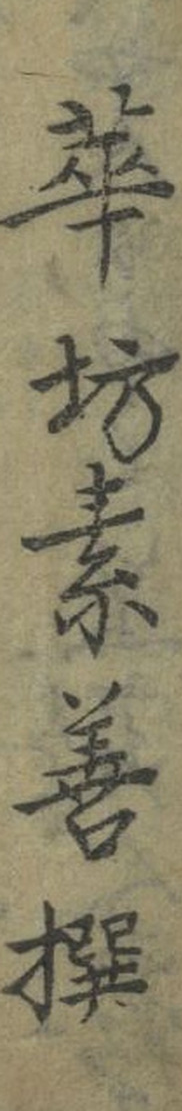華坊素善撰
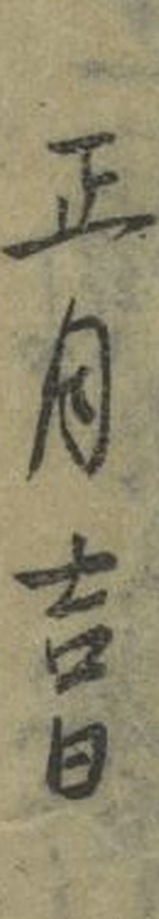正月吉日
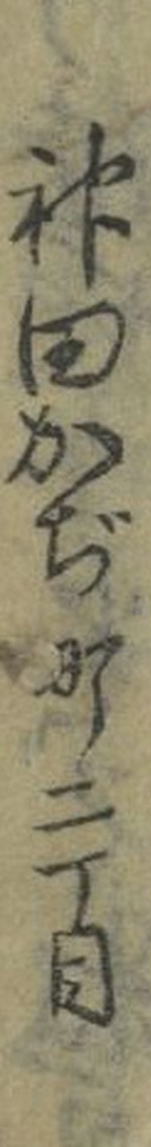神田かぢ町二丁目
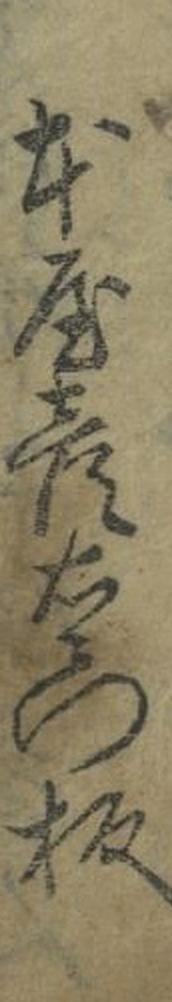本屋彦右衛門板
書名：琉球雑話
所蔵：University of the Ryukyus Library
